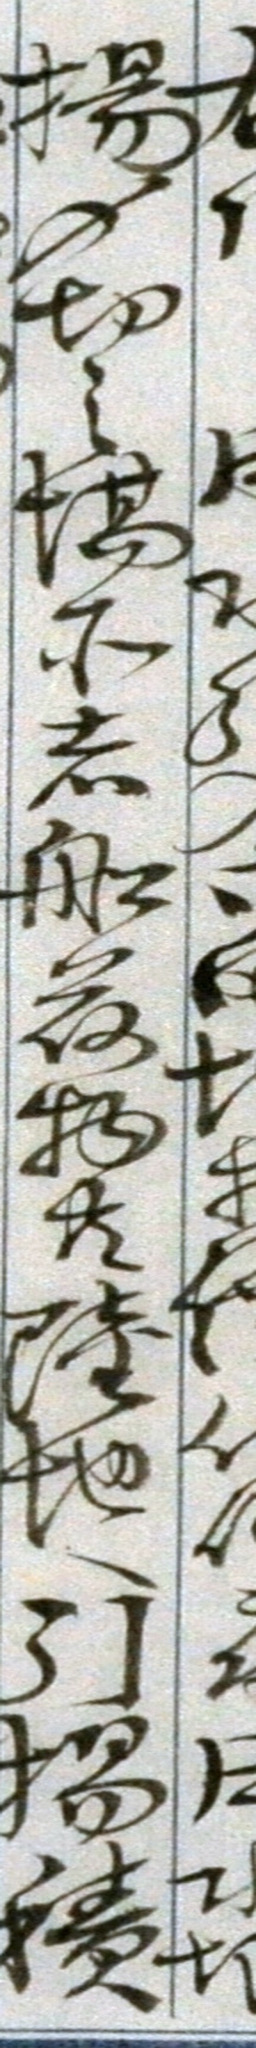揚〆切之場所者船荷物共陸地へ引揚積
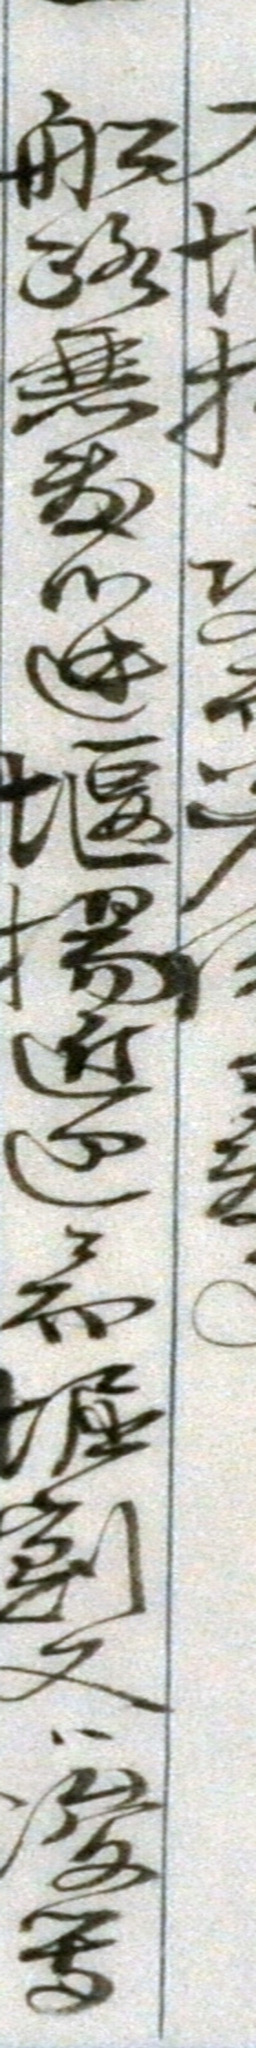一船路悪敷候迚堰場近辺ニ而掘割又ハ浚等
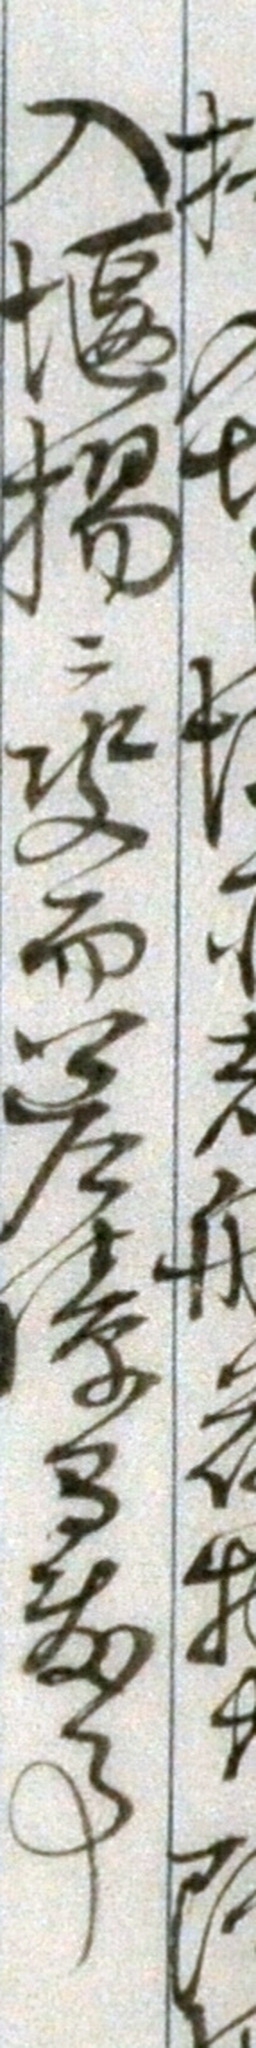入堰場ニ決而差障間敷事
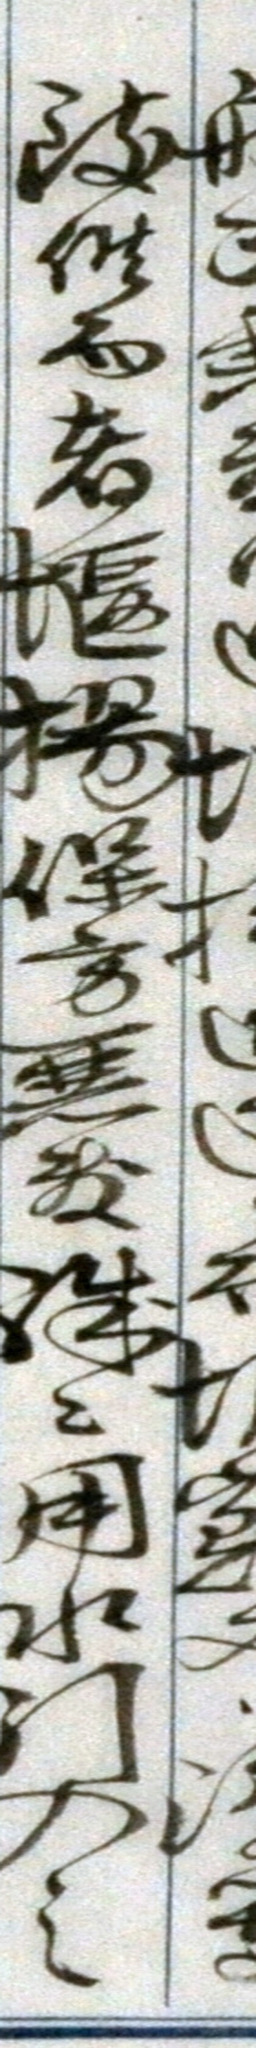致候而者堰場保方悪敷殊ニ用水引入之
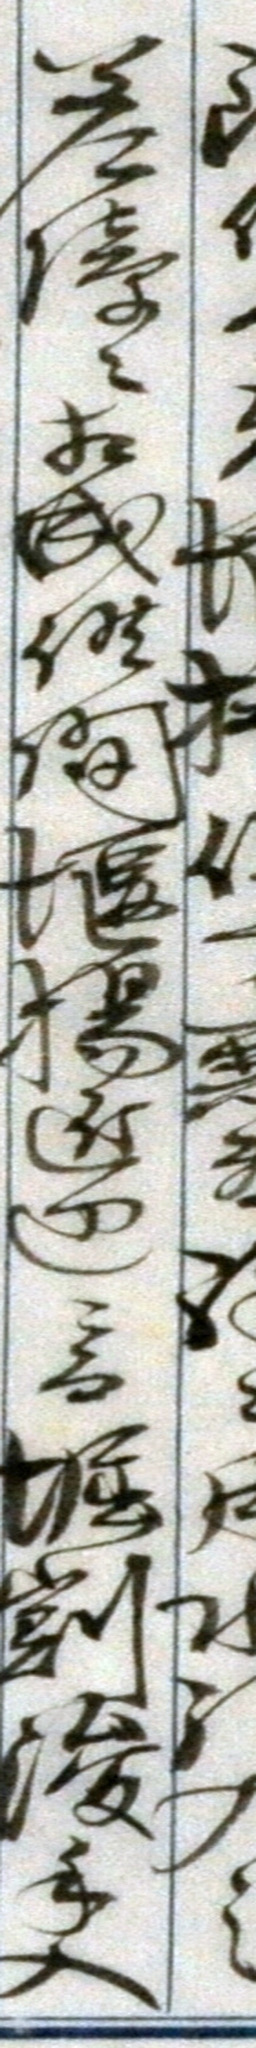差障ニ相成候間堰場近辺ニ而掘割浚手入
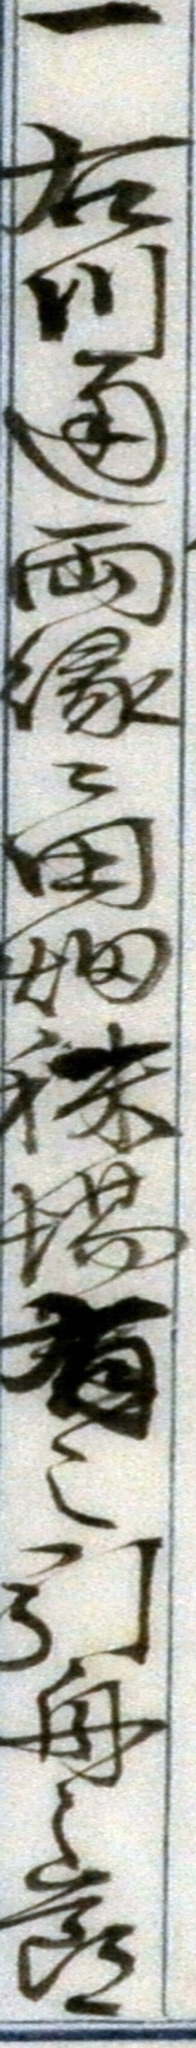一右川通両縁ニ田畑秣場有之引舟之節
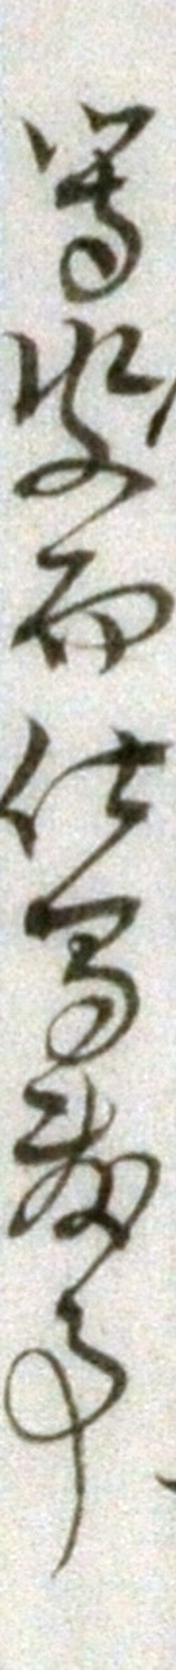等決而仕間敷事
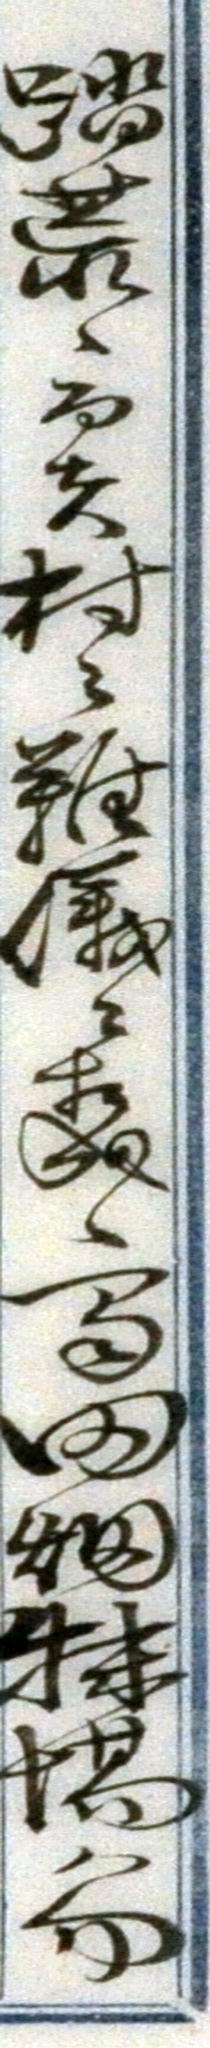踏荒候而者村々難儀ニ相成候間田畑秣場ハ勿
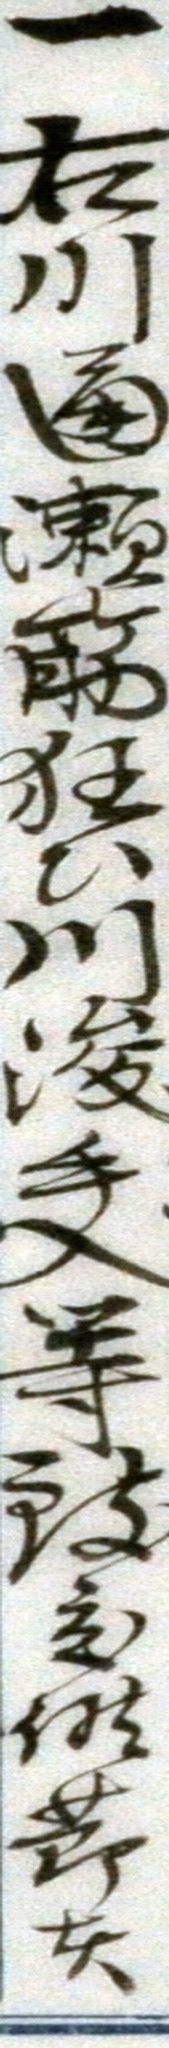一右川通瀬筋狂ひ川浚手入等致度候節者
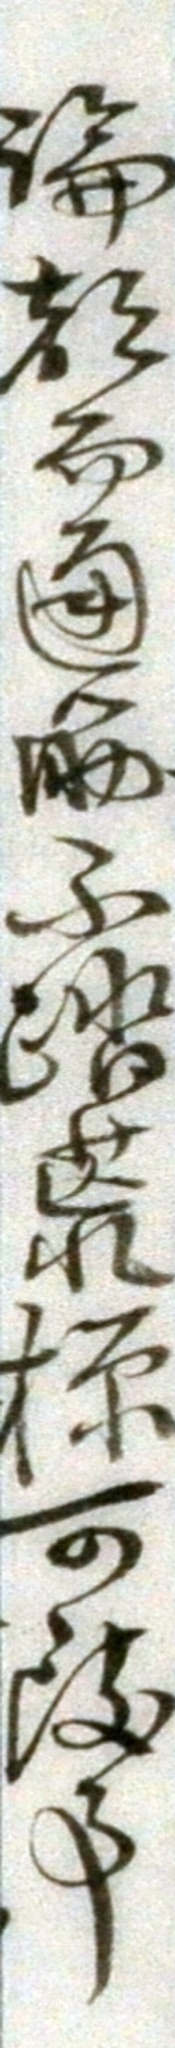論都而通筋不踏荒様可致事
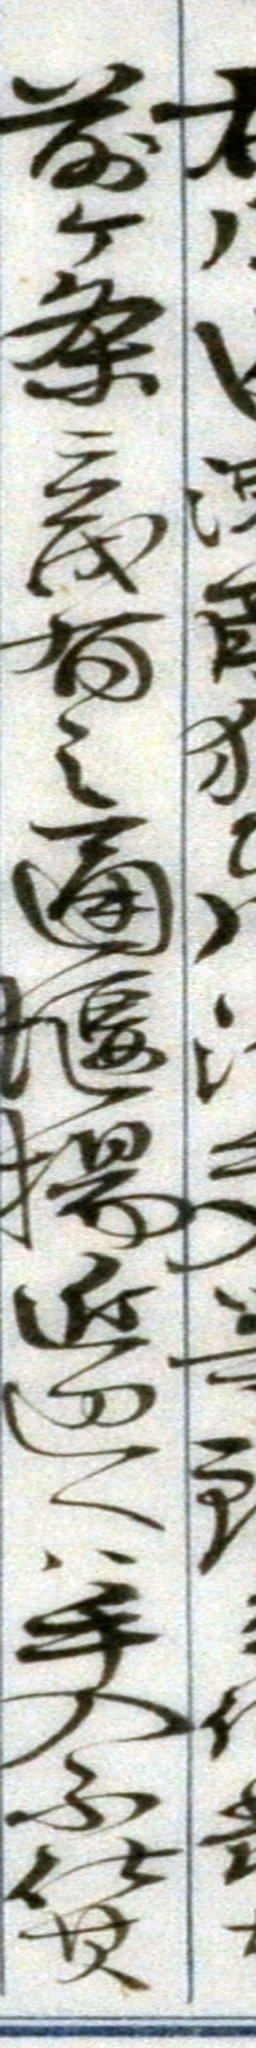前ヶ条ニも有之通堰場近辺ヘハ手入不仕其
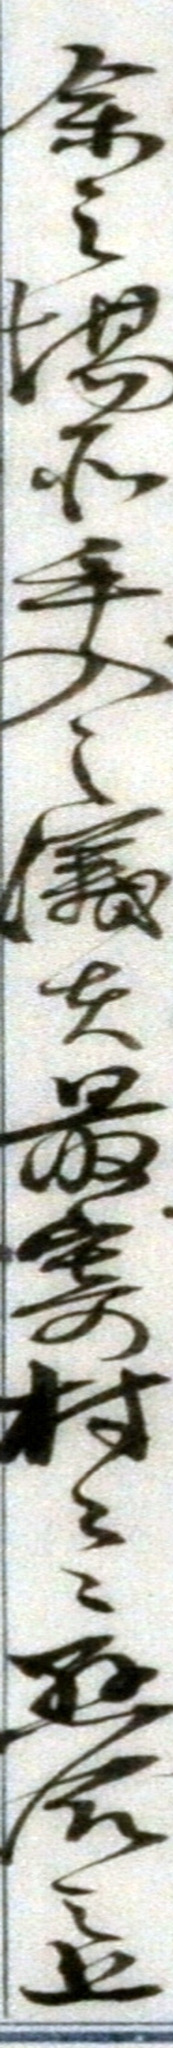余之場所手入之儀者最寄村々ニ懸合之上
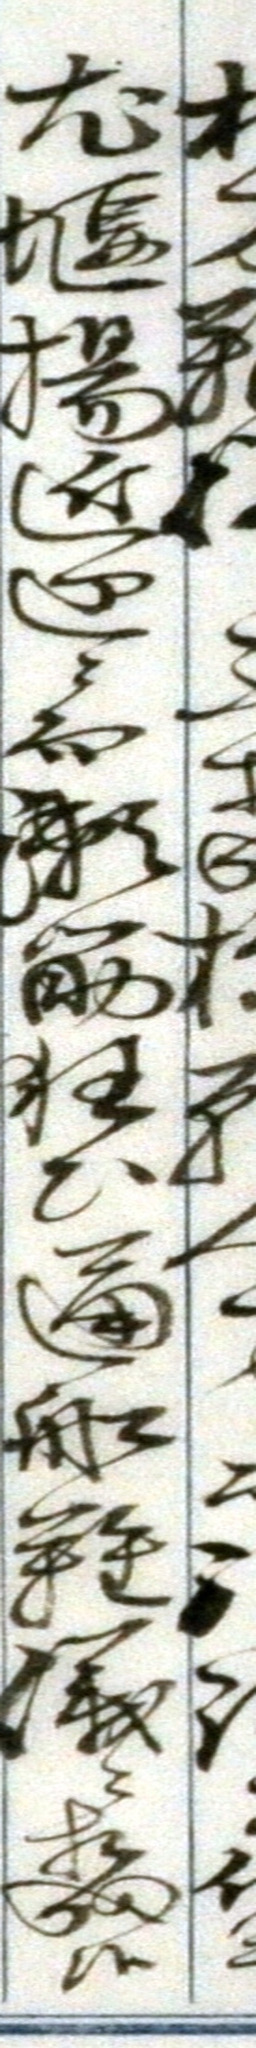尤堰場近辺ニ而瀬筋狂ひ通船難儀ニ相成候
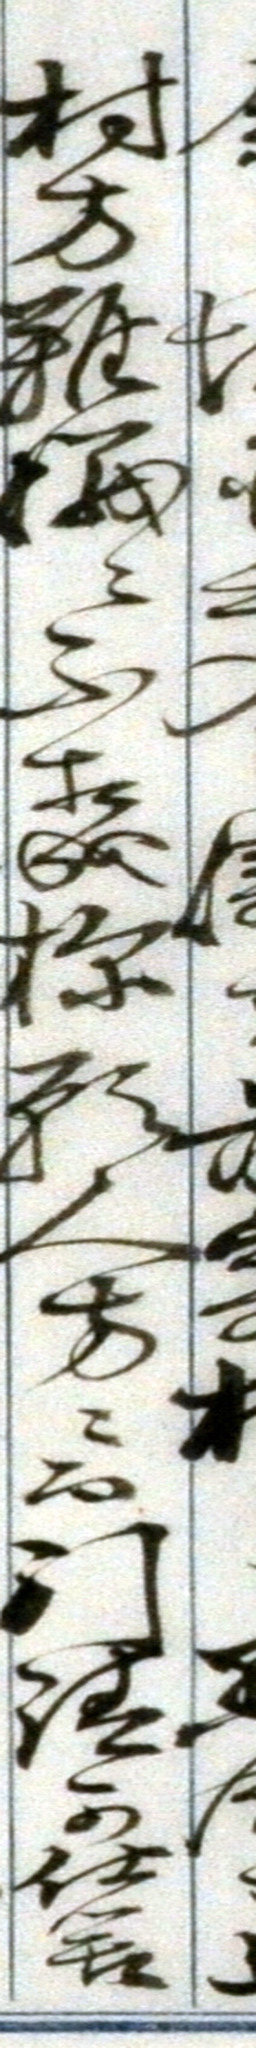村方難儀ニ不相成様願人方ニ而引請可仕置
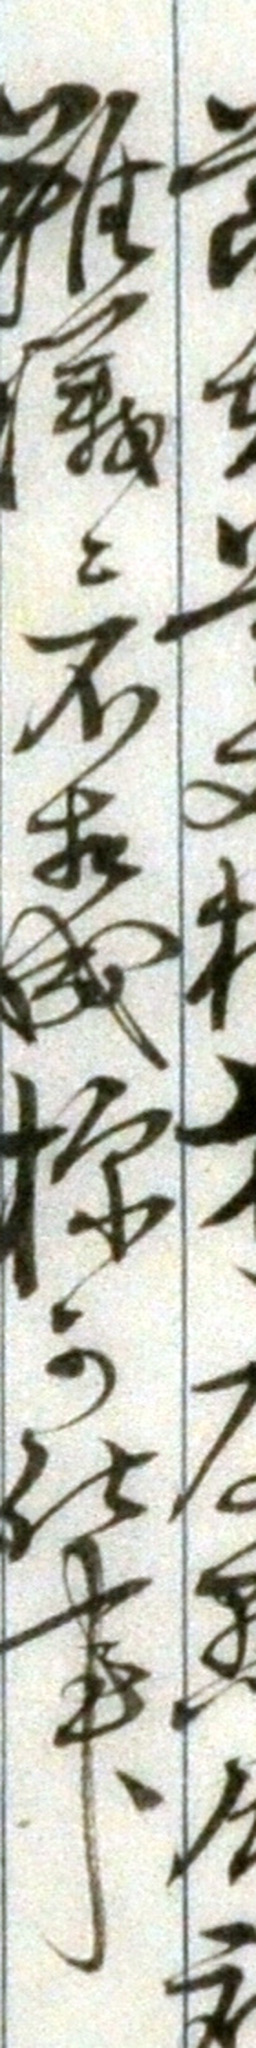難儀ニ不相成様可仕事
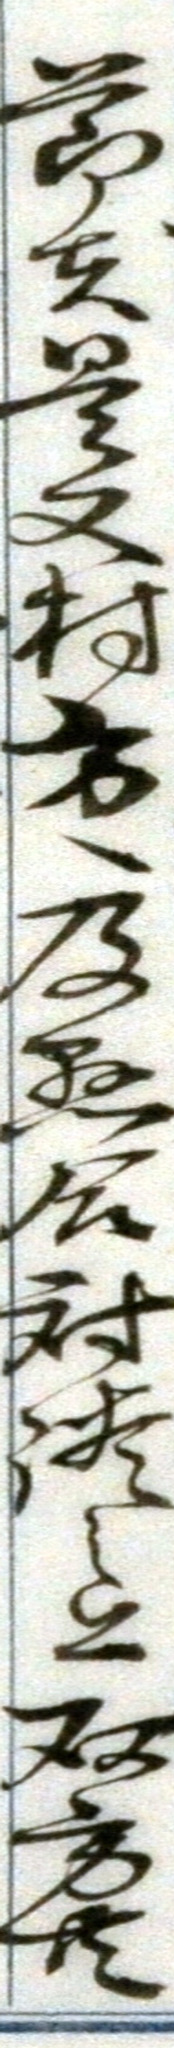節者是又村方へ及懸合対話之上双方共
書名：天竜川通船難渋願并取極書
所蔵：伊那市立高遠町図書館・合同会社AMANE
